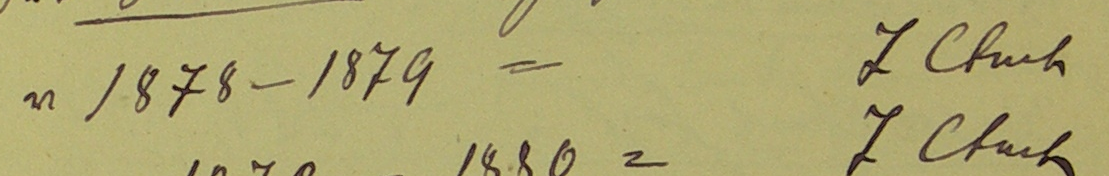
Von 1878-1879 = 7 cmtr
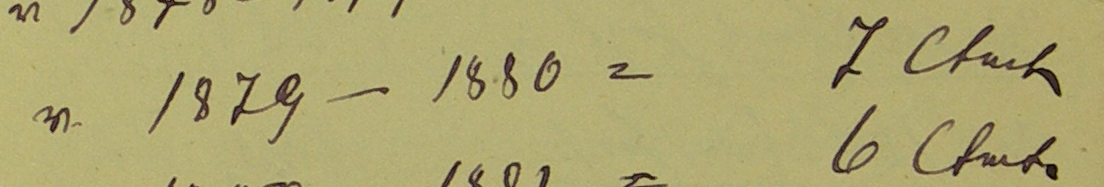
1879-1880 = 7 cmtr
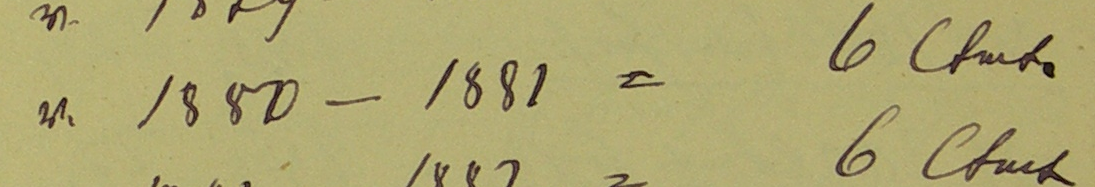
1880-1881 = 6 cmtr
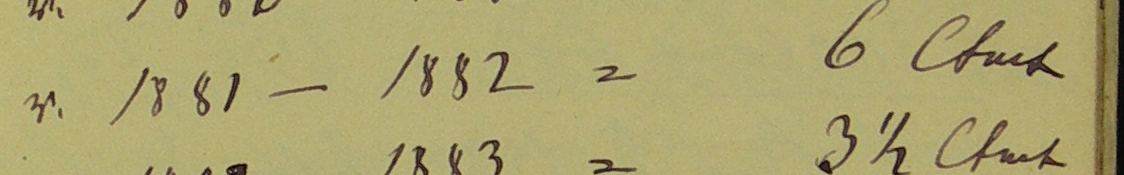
1881-1882 = 6 cmtr
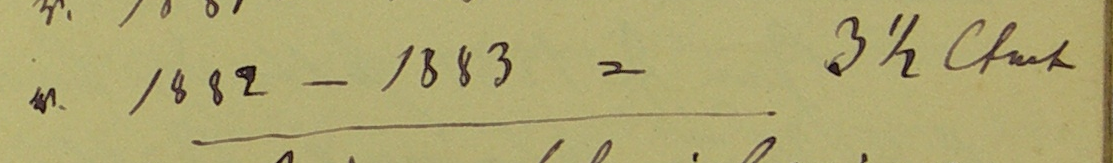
1882-1993 = 3 ½ cmtr
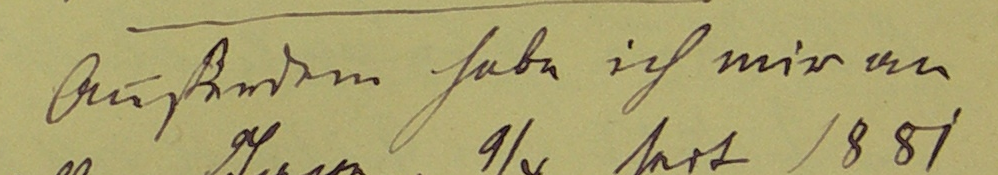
Außerdem habe ich mir an
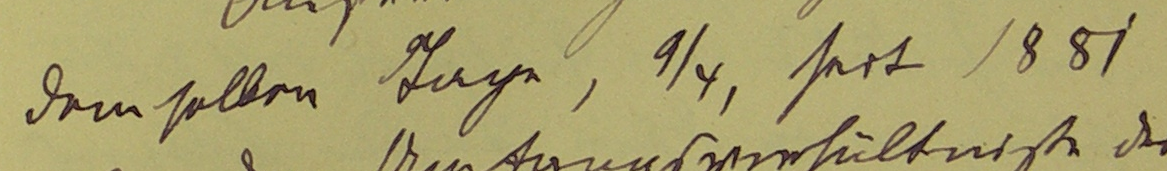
demselben Tage 9/4 seit 1881
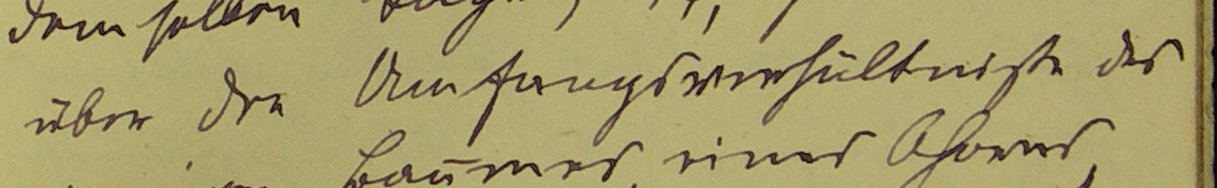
über die Umfangsverhältniße des
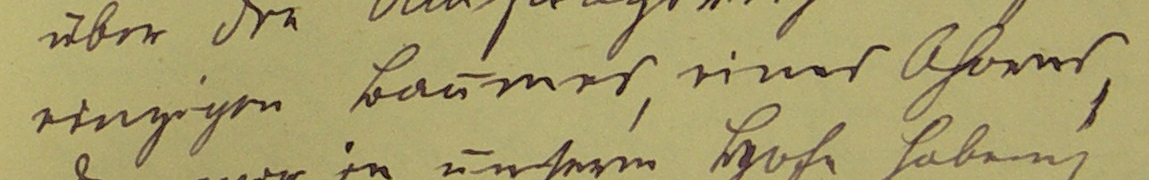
einzigen Baumes, eines Ahorns,
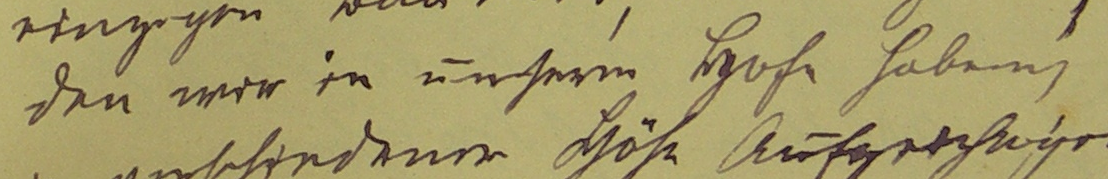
den wir in unserem Hof haben
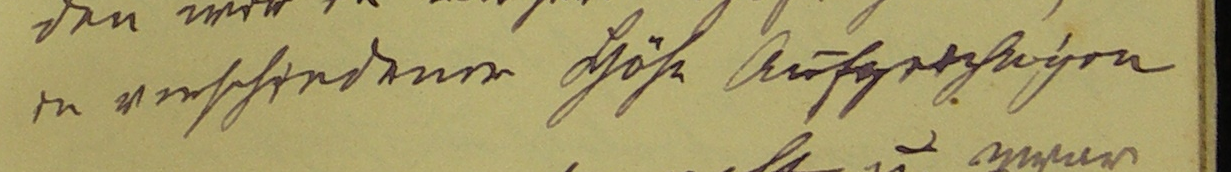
in verschiedener Höhe Aufzeichnungen
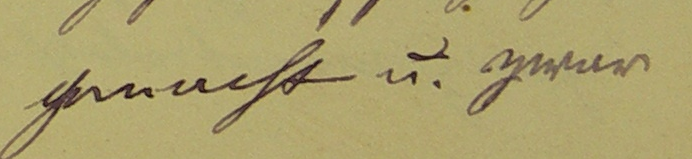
gemacht und zwar
